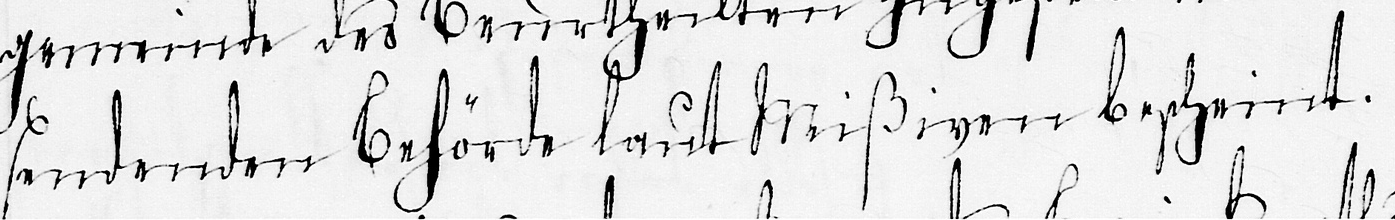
sendenden Behörde laut Mißiven bescheint.
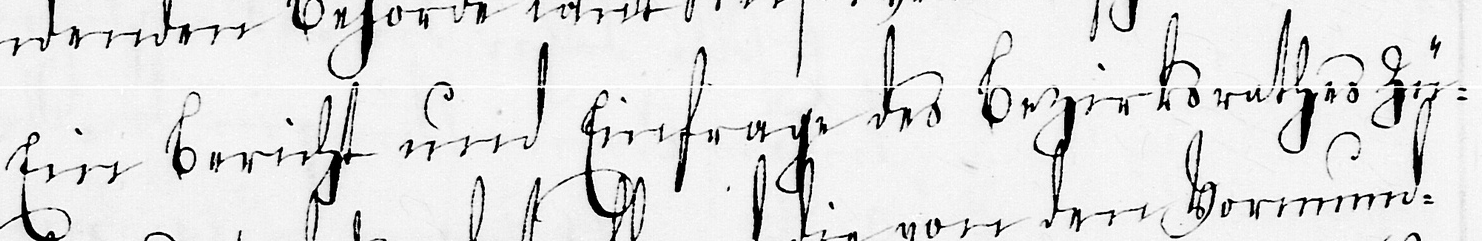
Ein Bericht und Einfrage des Bezirksrathes Zür¬
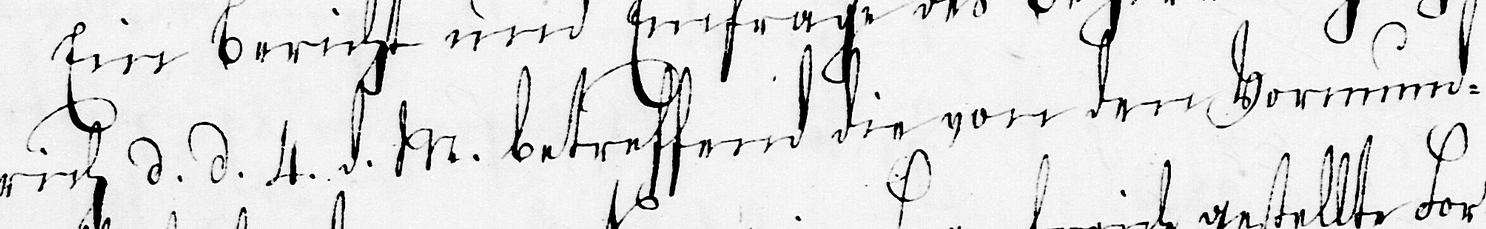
ich d. d. 4. d. M. betreffend die von den Vormunds¬
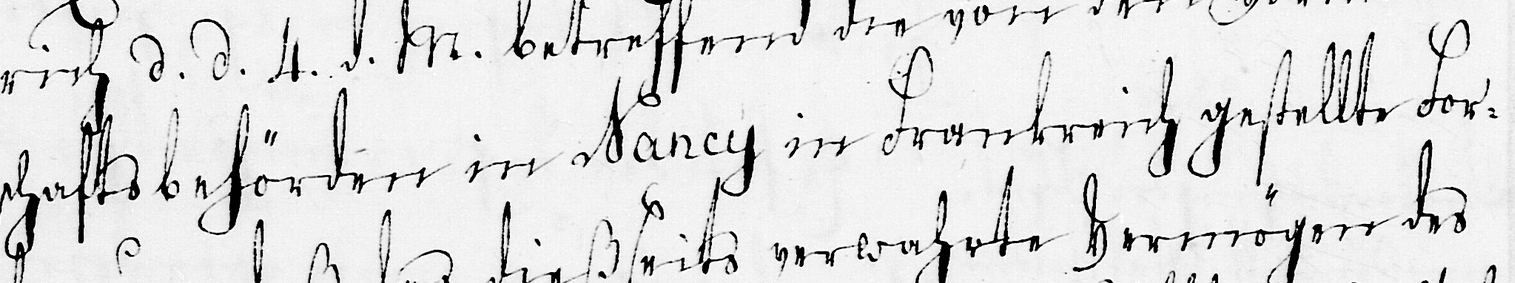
chaftsbehörden in Nancy in Frankreich gestellte For¬
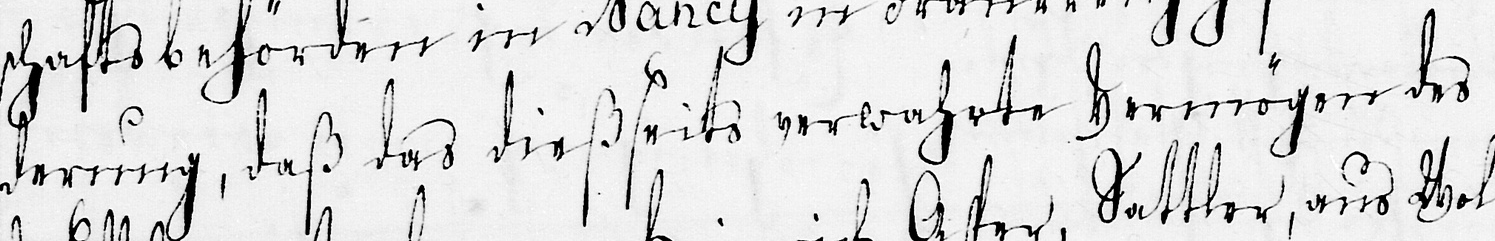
derung, daß das dießseits verwahrte Vermögen des
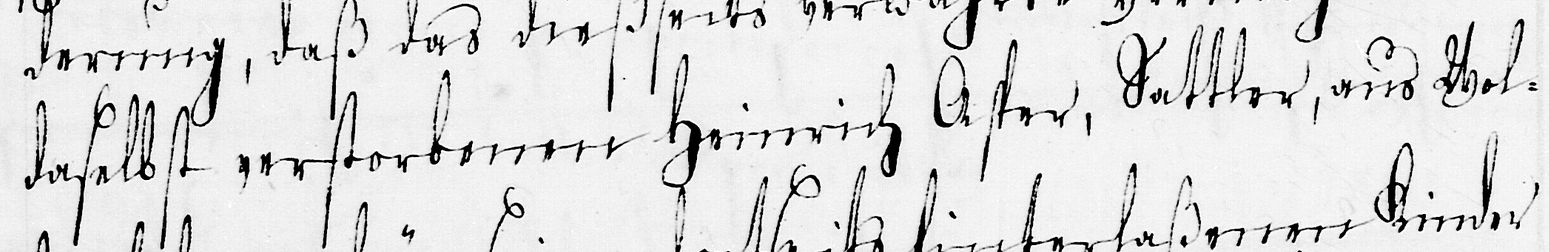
daselbst verstorbenen Heinrich Asper, Sattler, aus Wol¬
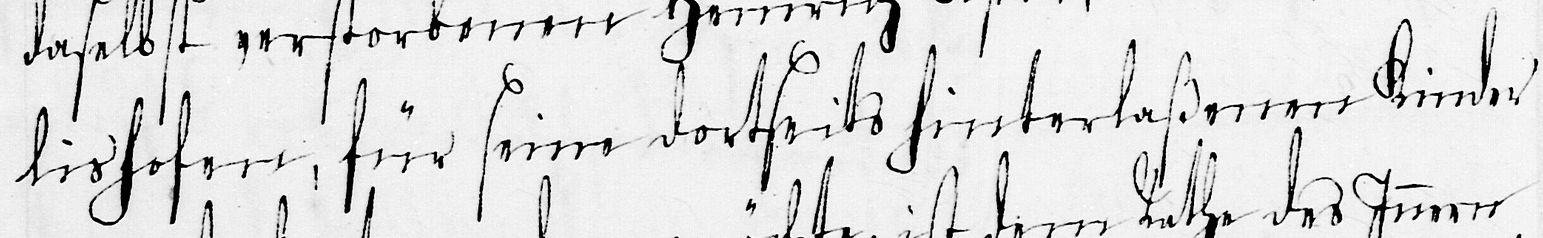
lishofen, für seine dortseits hinterlaßenen Kinder
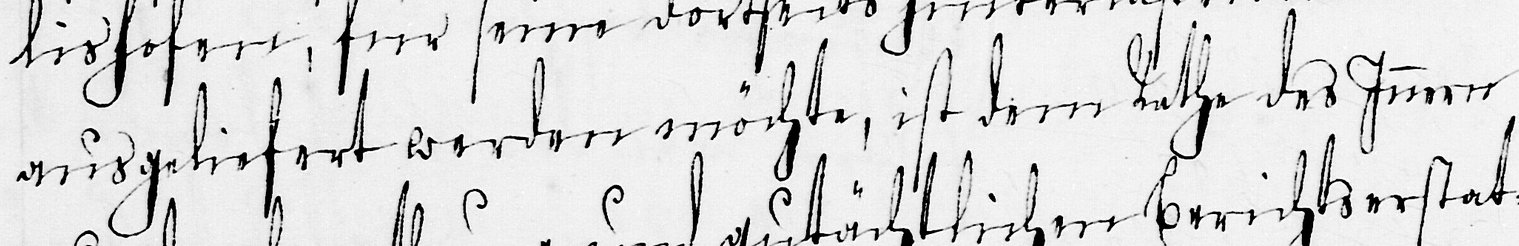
ausgeliefert werden möchte, ist dem Rathe des Innern
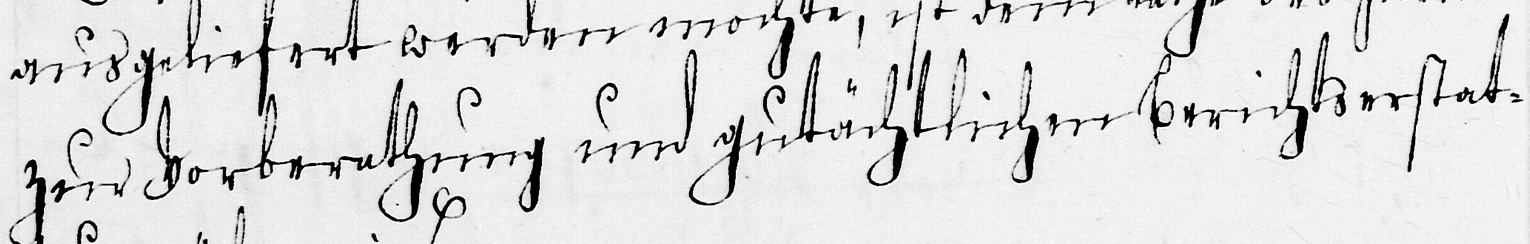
zur Vorberathung und gutächtlichen Berichtserstat¬
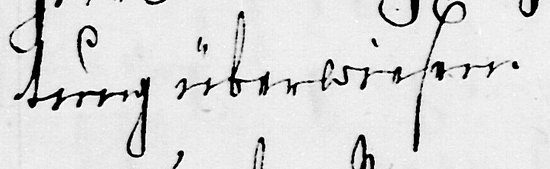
tung überwiesen.
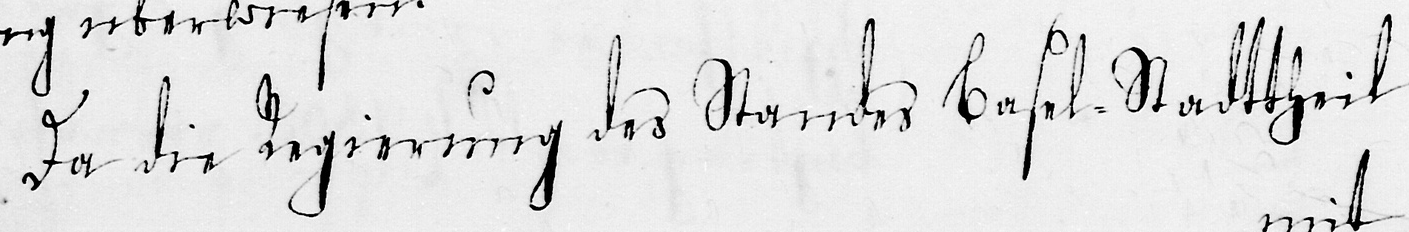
Da die Regierung des Standes Basel-Stadttheil
